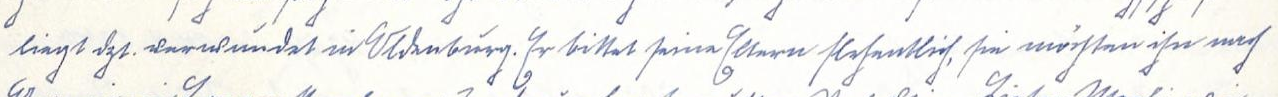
liegt dzt. verwundet in O,denburg. Er bitte seine Eltern flehentlich, sie möchte ihn nach
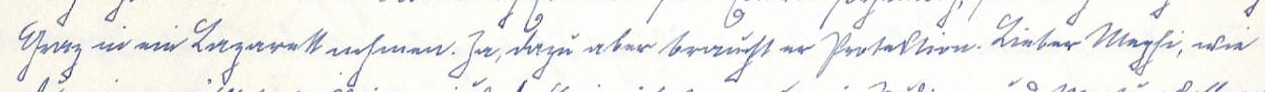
Graz in ein Lazarett nehmen. Ja, dazu aber brauchte er Protektion. Lieber Mephi, wie
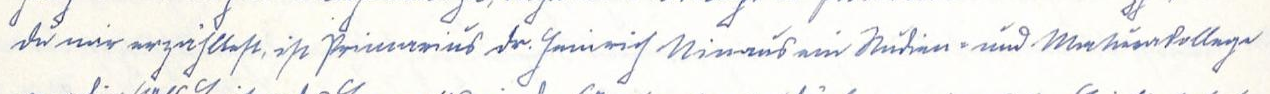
die mir erzähltest, ist Primarius Dr. Heinrich Ninaus ein Studien- und. Maturakollege
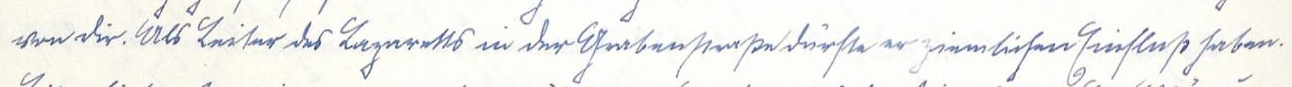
von dir. Als Leiter des Lazaretts in der Grabenstraße dürfte er ziemlichen Einfluß haben.
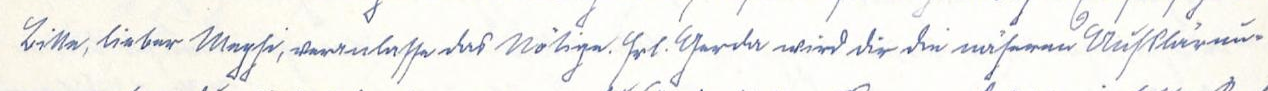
Bitte, lieber Mephi, veranlasse das Nötige. Frl. Gerda wird dir die nähern Aufklärun-
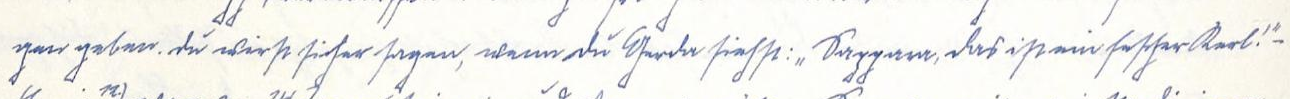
gen geben. Du wirst sicher sagen, wenn du Gerda siehst: „Sappara,. das ist ein fescher Kerl!"
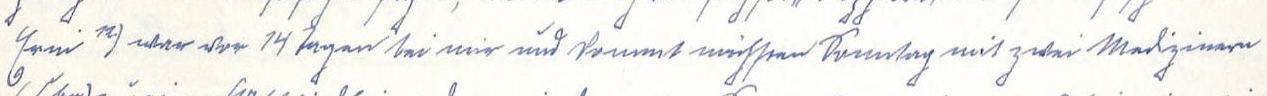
Erni war vor 14 Tagen bei mir und kommt nächsten Sonntag mit zwei Medizinerm
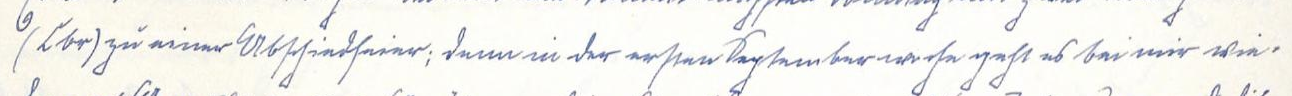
(CVer) zu einer Abschiedfeier; denn in der ersten Septemberwoch geht es bei mir wie-
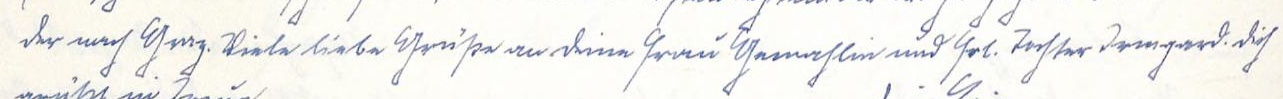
der nach Graz. Viele liebe Grüße an deine Frau Gemahlin und Frl Tochter Irngard dich
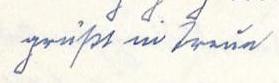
grüßt in Treue
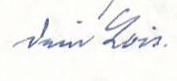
Dein Lois
